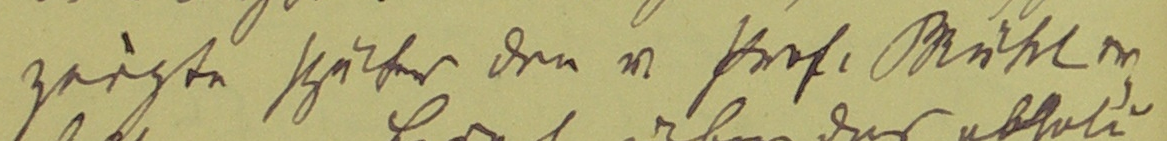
zeigte später den von Prof Mühl im
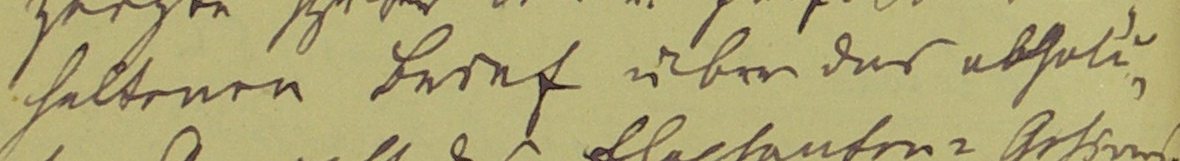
seltenen Beruf über das absolu¬
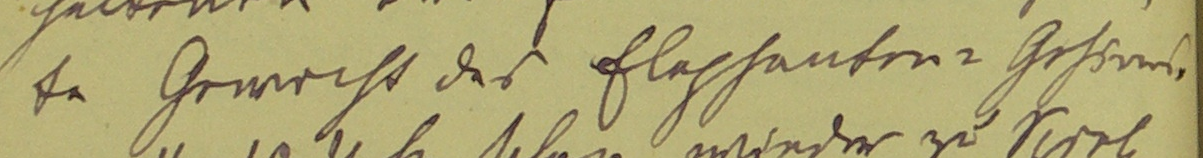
te Gewicht des Elephanten –Gehirns
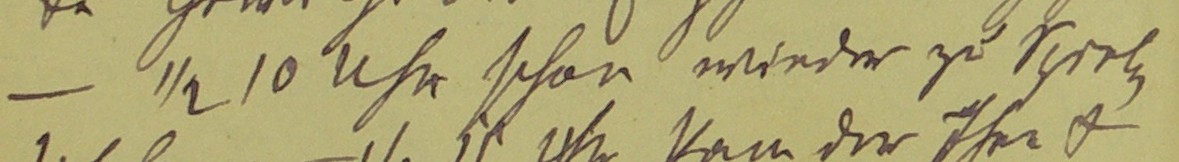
—1/2 10 Uhr schon wieder zu Spiel¬
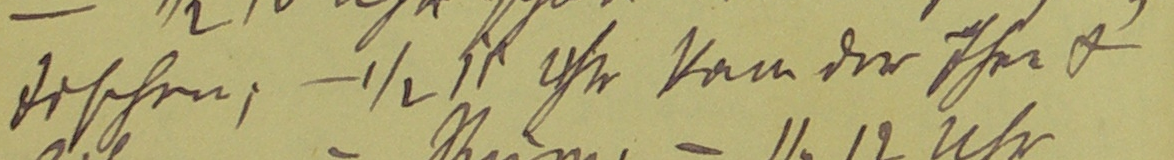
tischen;--1/2 1 Uhr der Thee mit
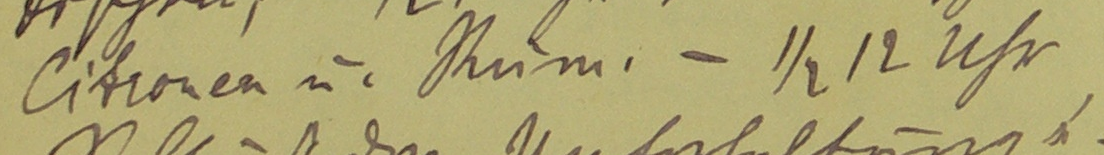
Citronen und Rum.—1/2 12 Uhr
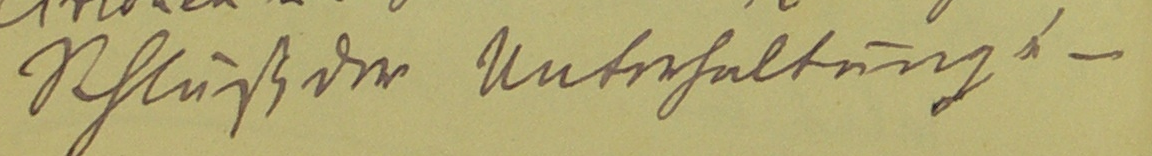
Schluß der Unterhaltung..—
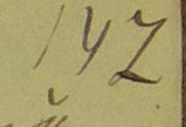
147
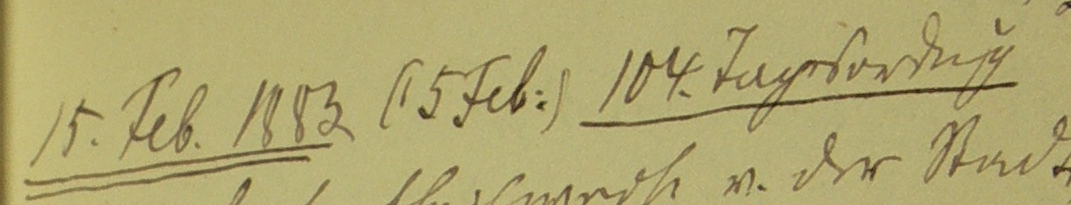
15. Februar 1883. (: 5. Febr: .:) 104 Tagesordnung.
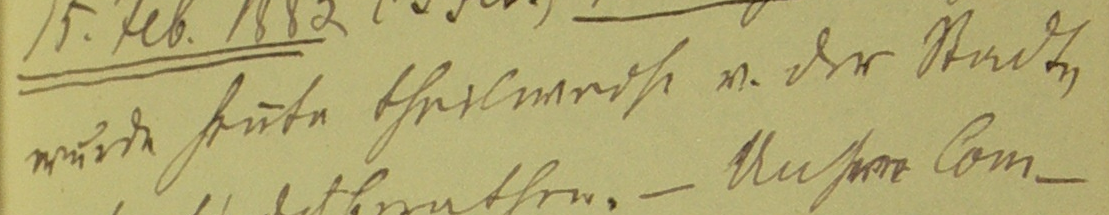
Wurde heute theilweise von der Stadt¬
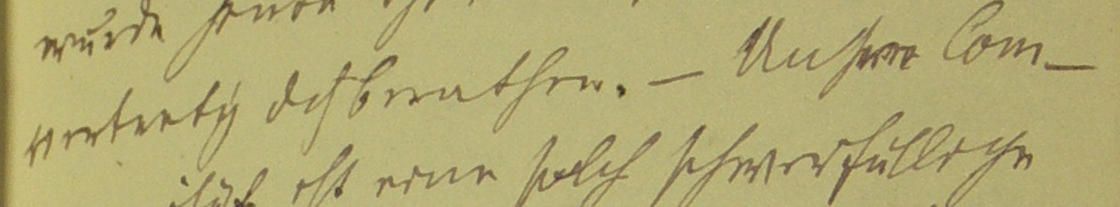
verwaltung durchberaten.—Unsere Com¬
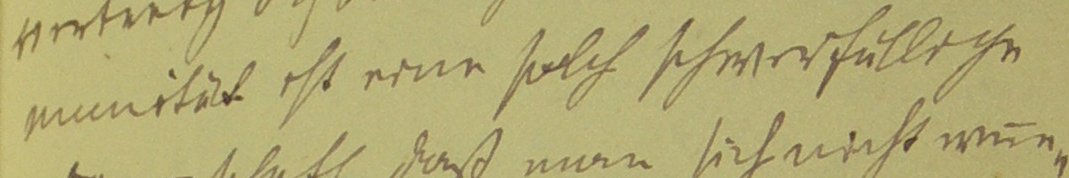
unität ist eine solch schwerfällige
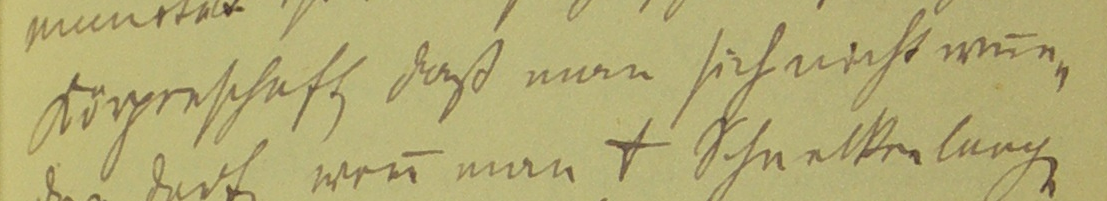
Körperschaft , daß man sich nicht wun¬
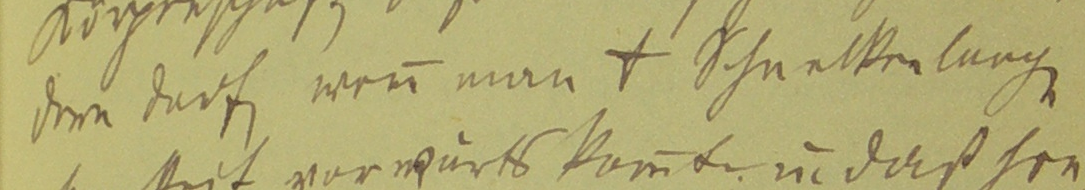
dern darf, wenn man mit Schneckenlang¬
